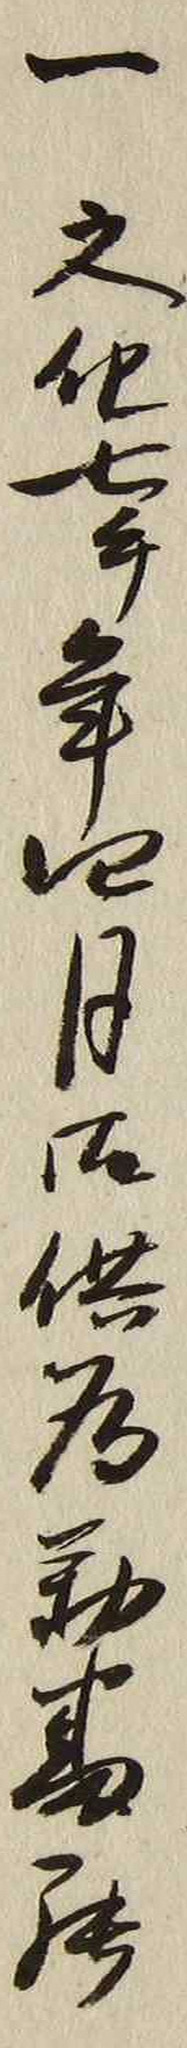一文化七午年四月御供為勤番罷
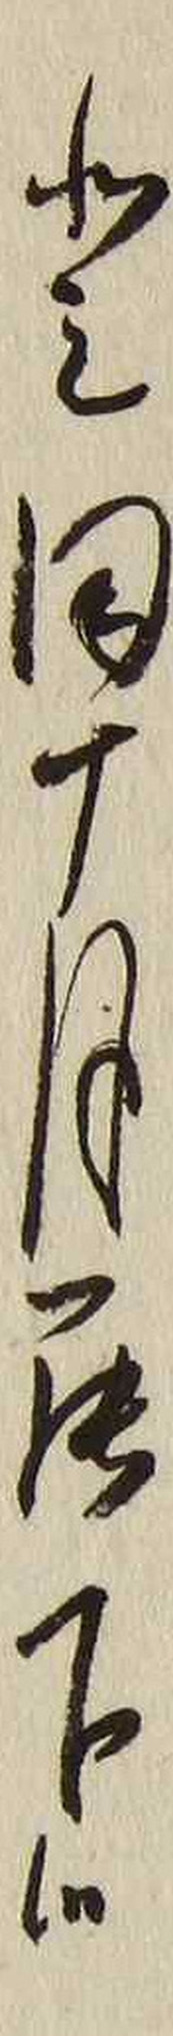登同十月罷下候

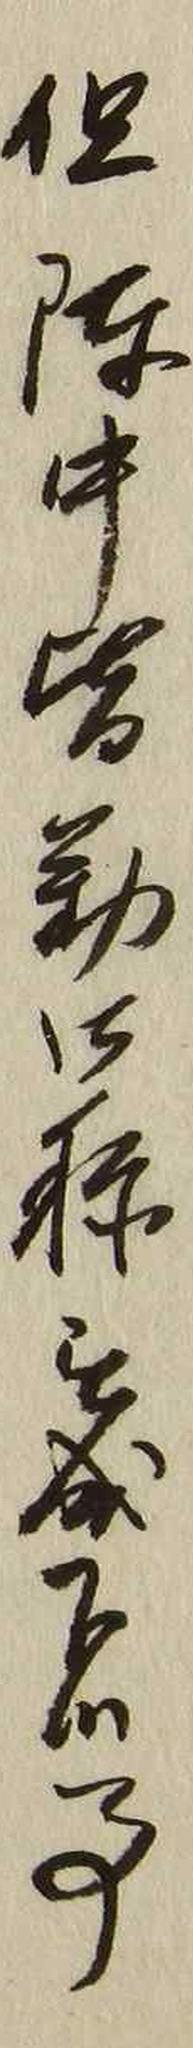但陣中皆勤御称被成下候事
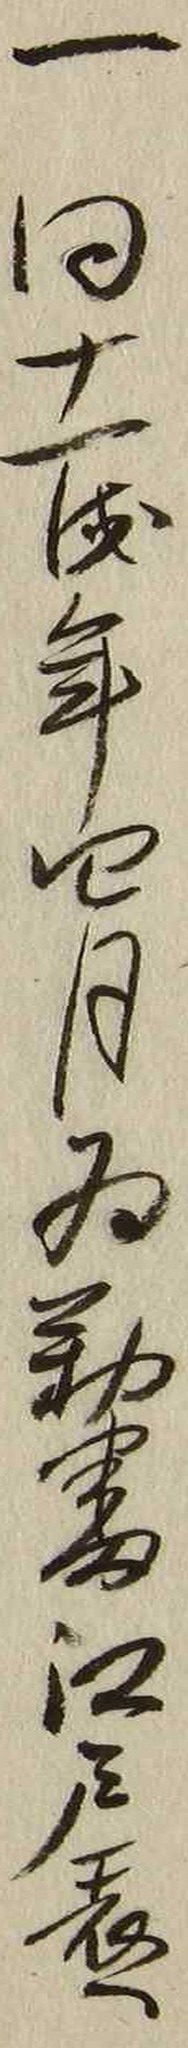一同十一戌年四月為勤番江戸表へ
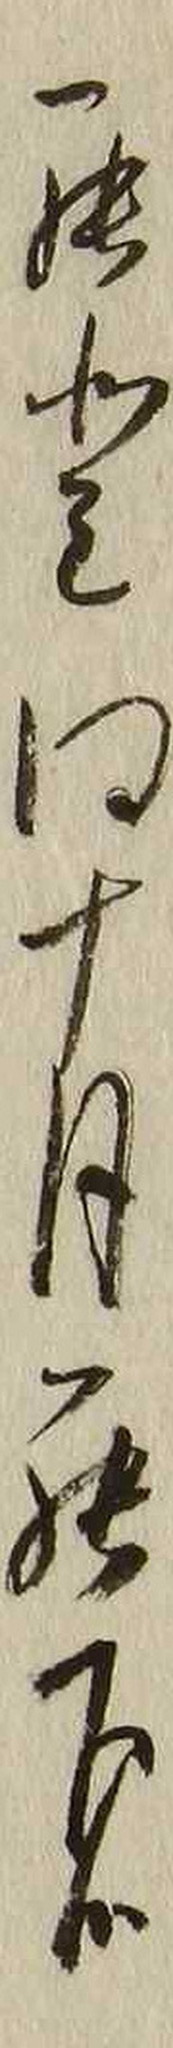罷登同十月罷下候
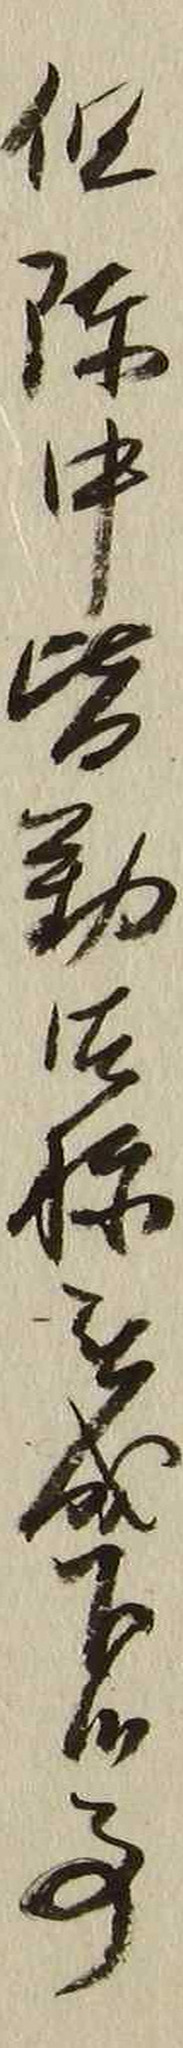但陣中皆勤御称被成下候事
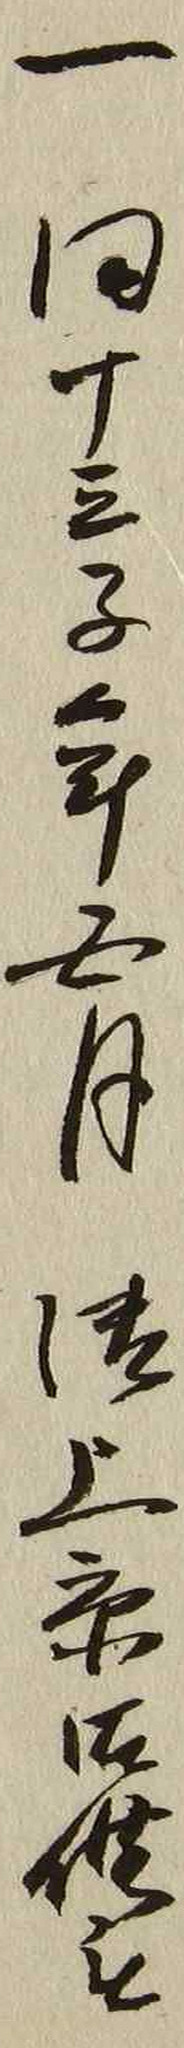一同十三子年五月御上京御供被
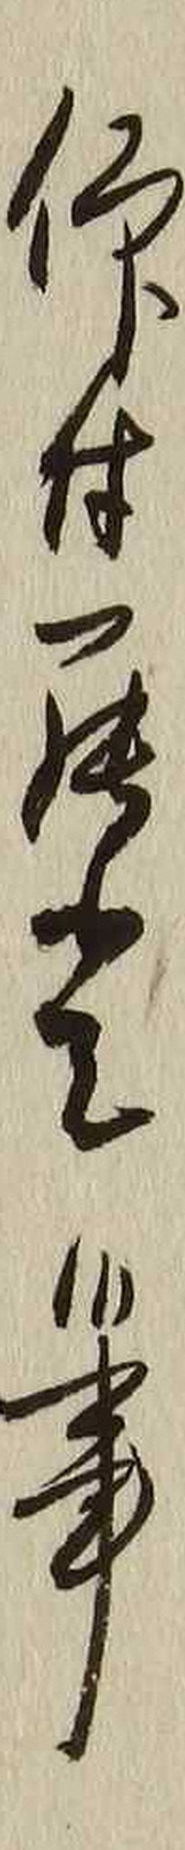仰付罷登候事
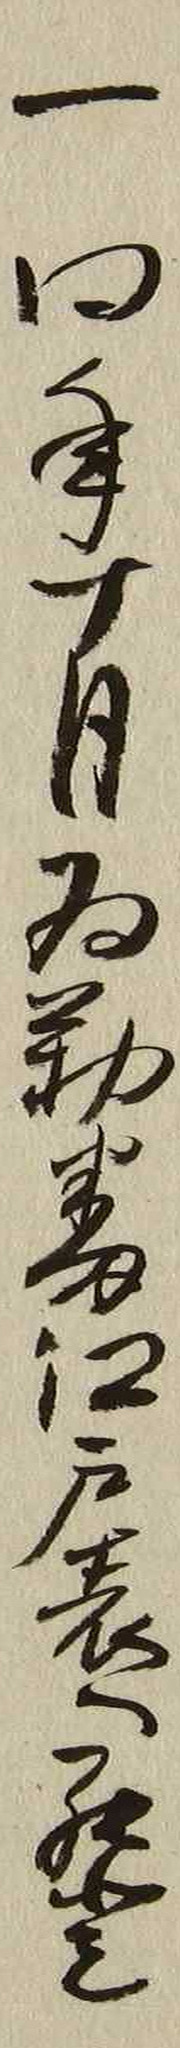一同年十月為勤番江戸表へ罷登
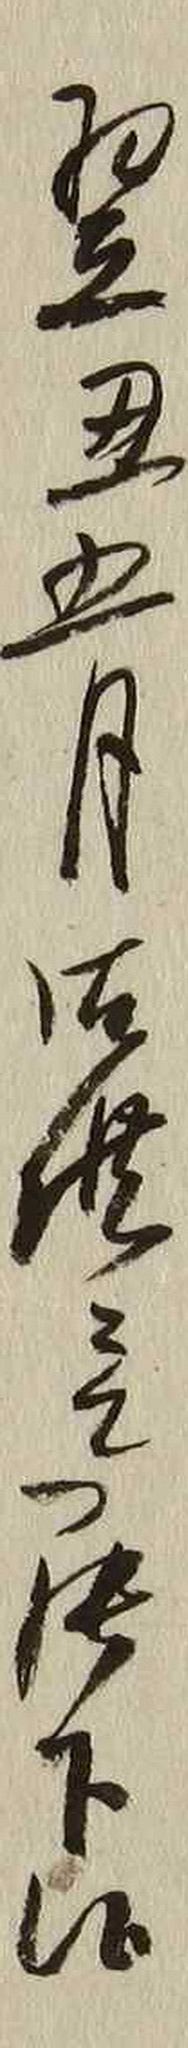翌丑五月御供ニて罷下候
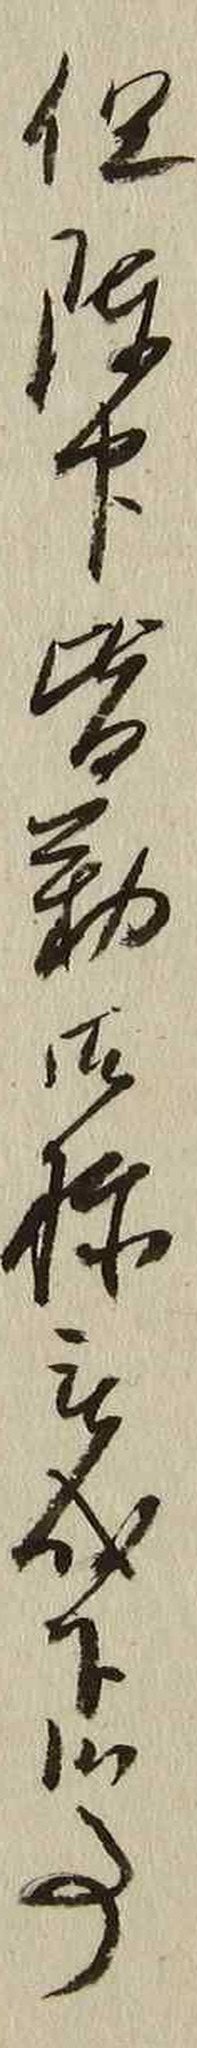但陣中皆勤御称被成下候事
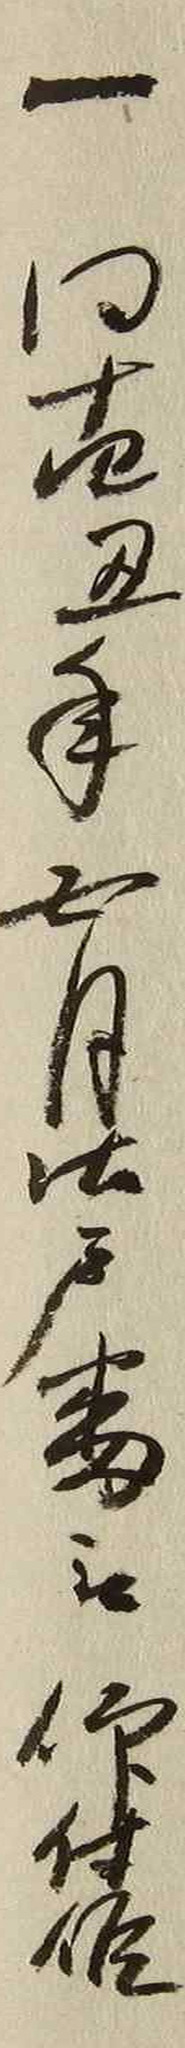一同十四丑年五月御戸番被仰付候
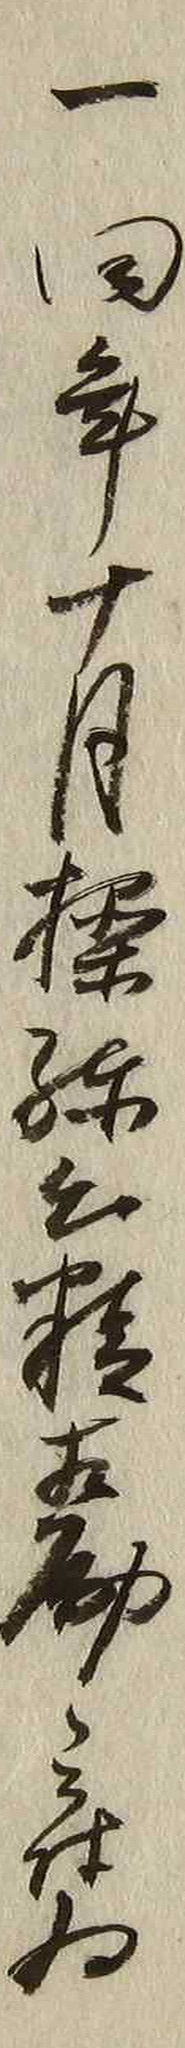一同年十月操練出精相励候ニ付為
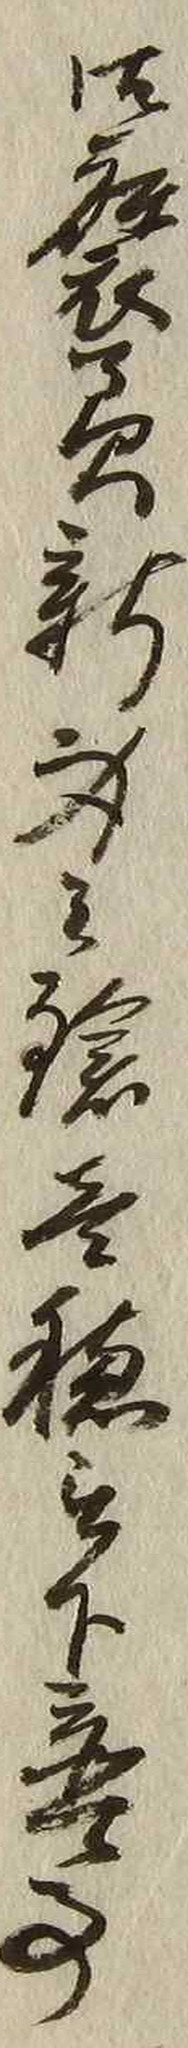御褒美新身之鎗壱穂被下置候事
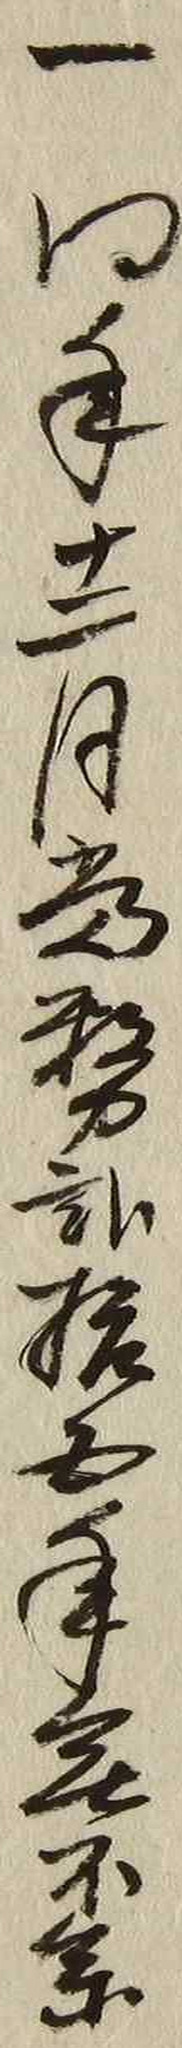一同年十二月当務弐拾五年無不参
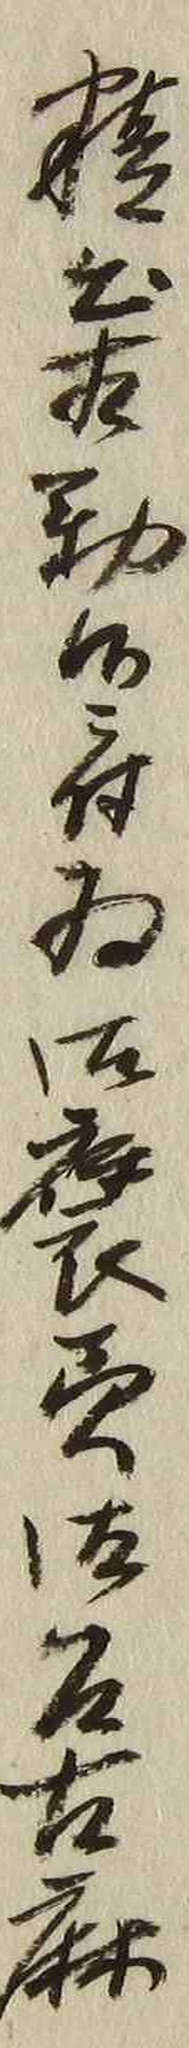精出相勤候ニ付為御褒美御召古麻
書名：諸士系譜　巻之346　も之部2
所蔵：会津若松市立会津図書館
